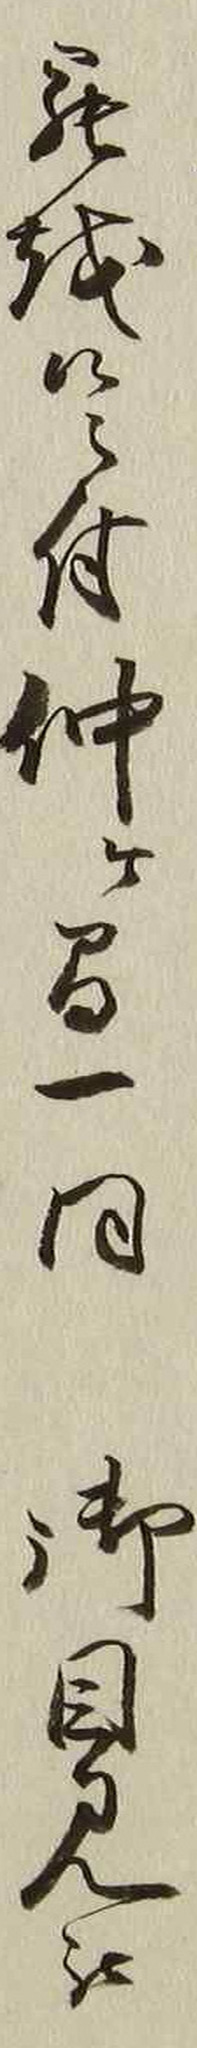罷越候ニ付仲ケ間一同御目見被
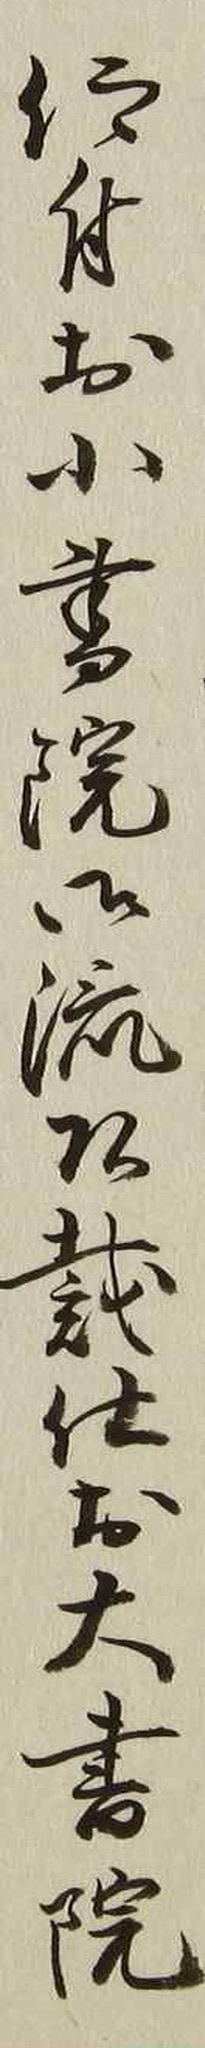仰付於小書院御流頂戴仕於大書院
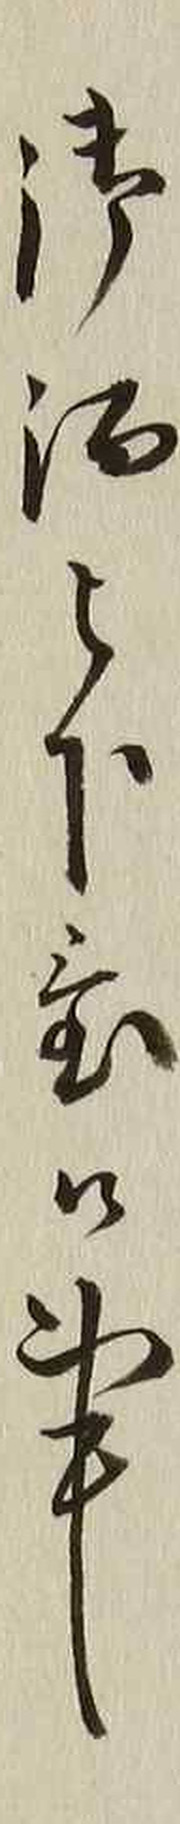御酒被下置候事
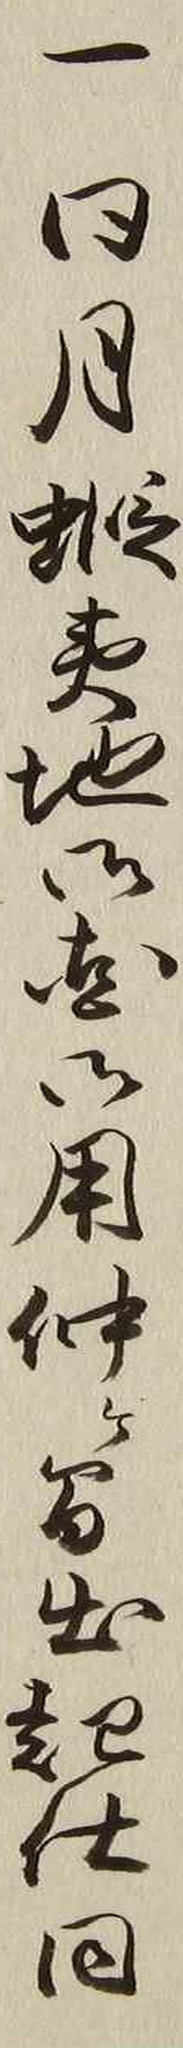一同月蝦夷地御固御用仲ケ間出起仕同
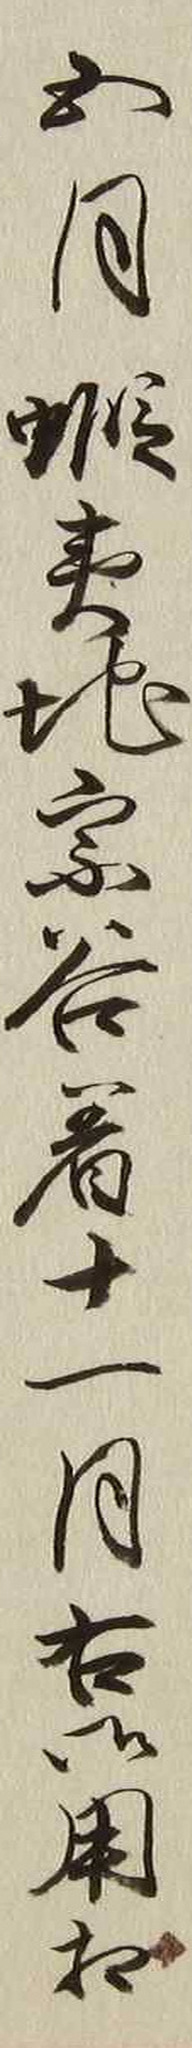五月蝦夷地宗谷着十一月右御用相
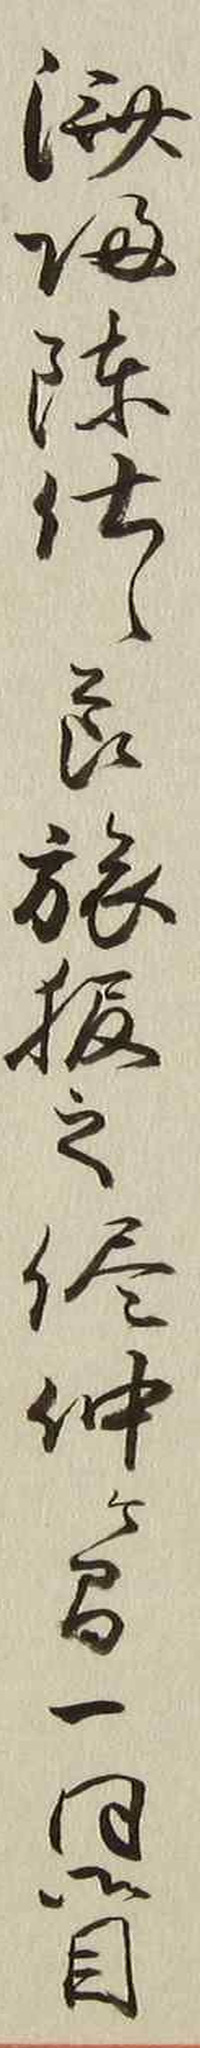済帰陣仕候節旅服之侭仲ケ間一同御目
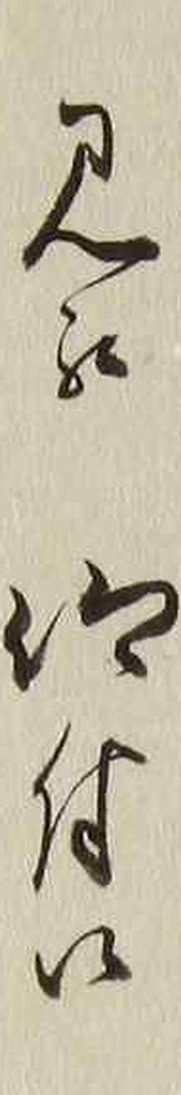見被仰付候
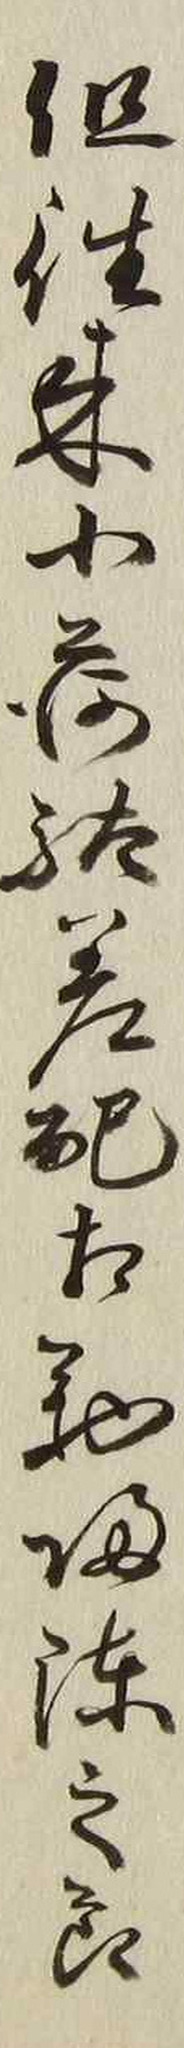但往来小荷駄差配相勤帰陣之節
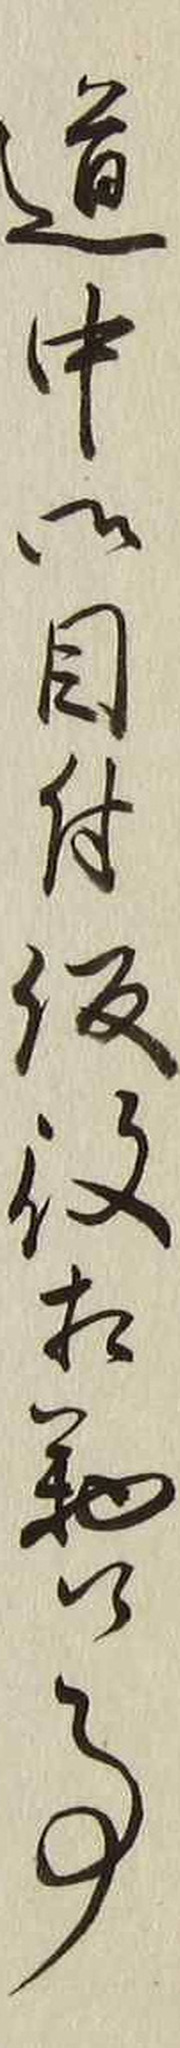道中御目付仮役相勤候事
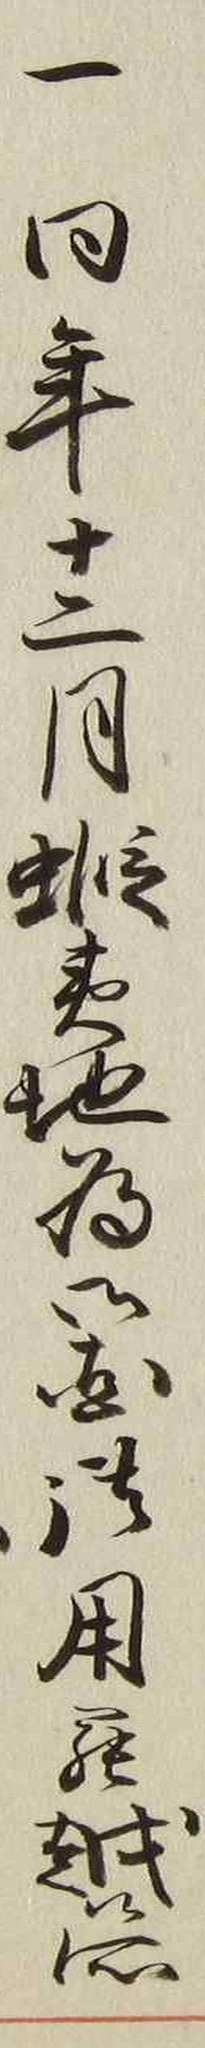一同年十二月蝦夷地為御固御用罷越候所
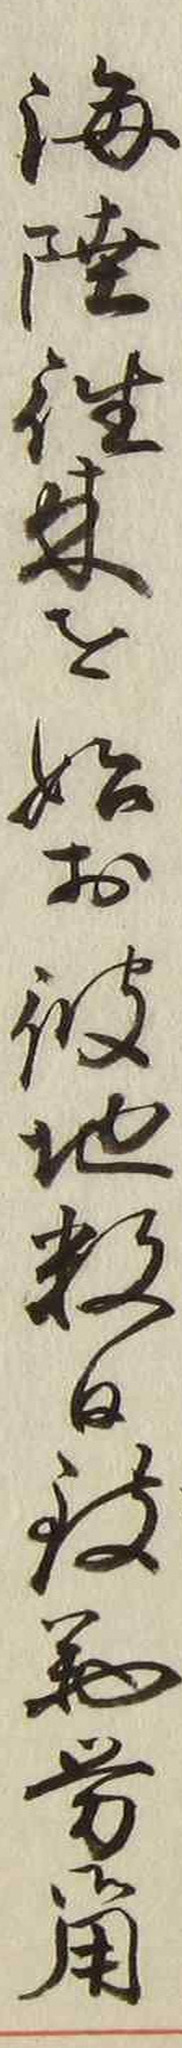海陸往来を始於彼地数日致勤労御用
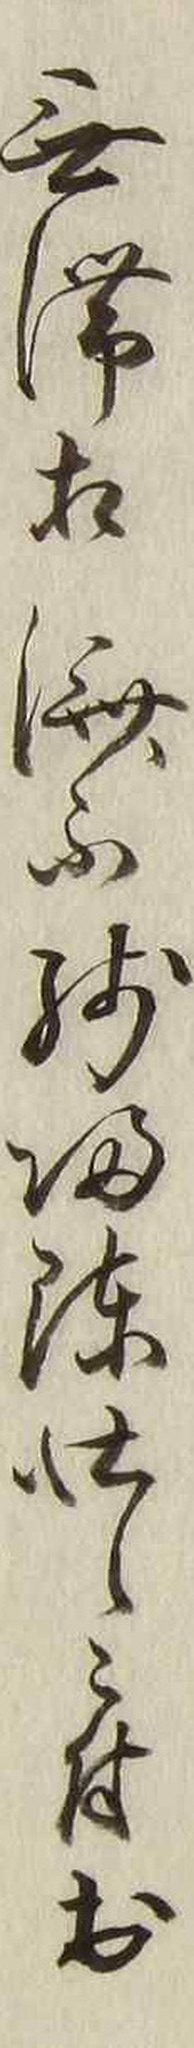無滞相済不残帰陣仕候ニ付於
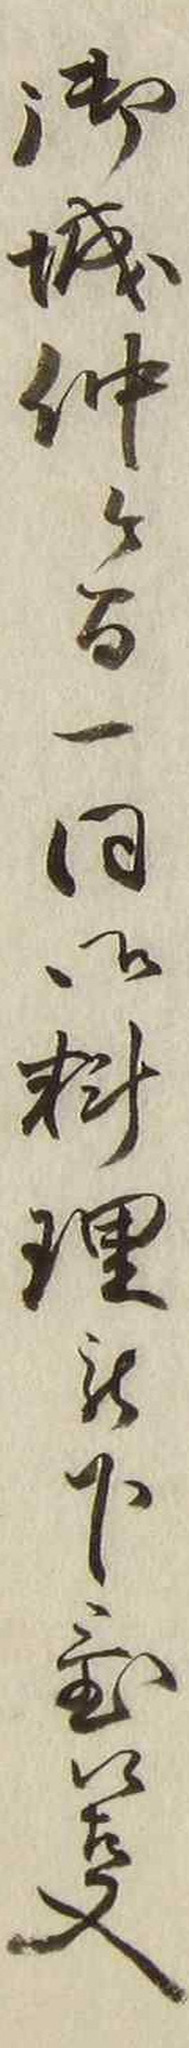御城仲ケ間一同御料理被下置候事

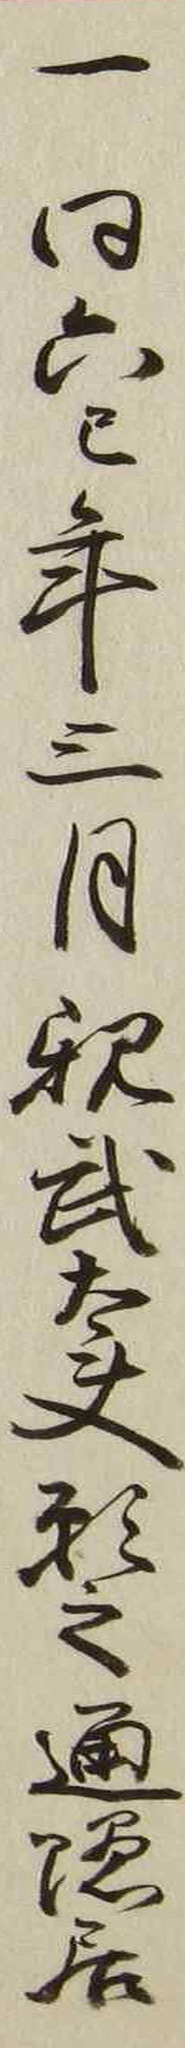一同六巳年三月親武太夫願之通隠居
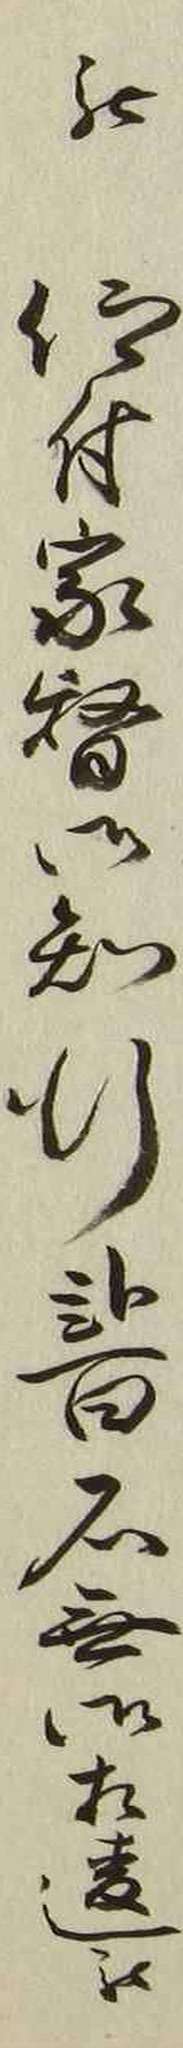被仰付家督御知行弐百石無御相違被
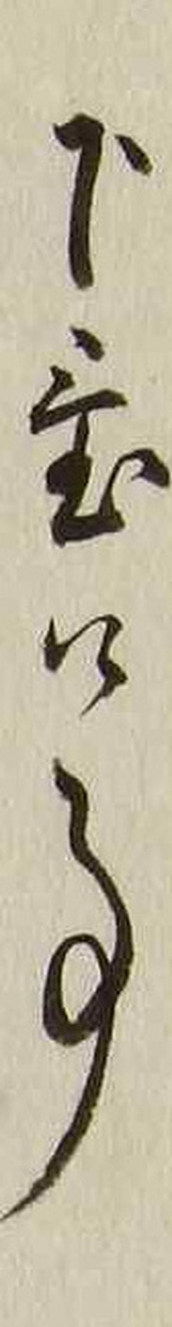下置候事
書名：諸士系譜　巻之21　い之部21
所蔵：会津若松市立会津図書館
